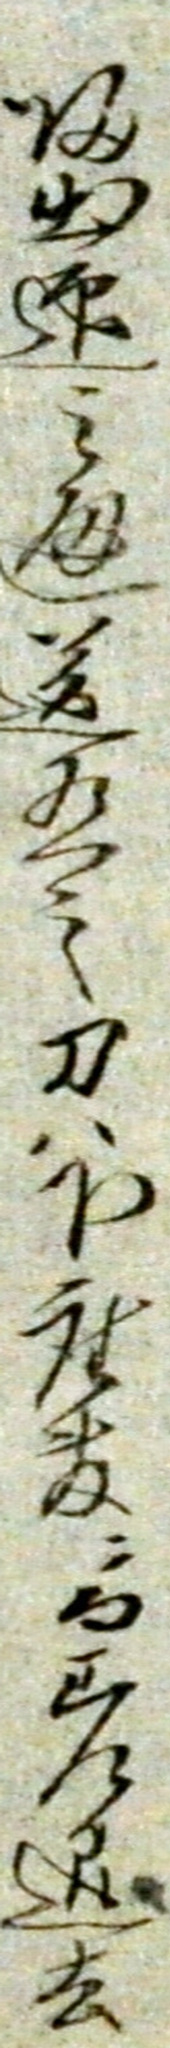出迎之通送有之刀ㇵ下座敷ニ而差退去
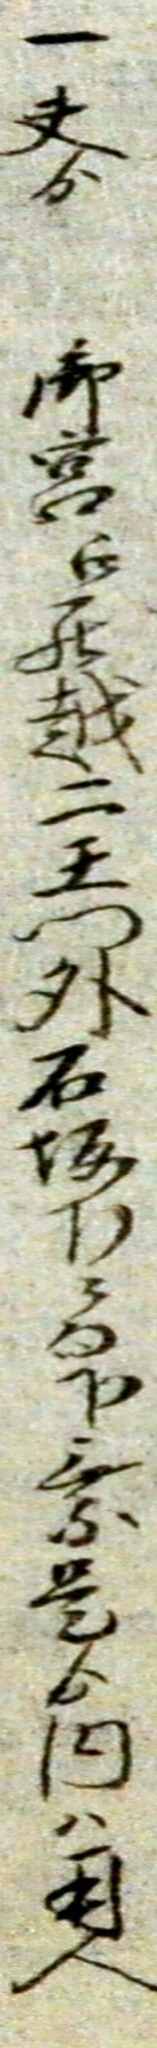一夫ゟ御宮江罷越二王門外石坂下ニ而下乗是ゟ内ㇵ用人
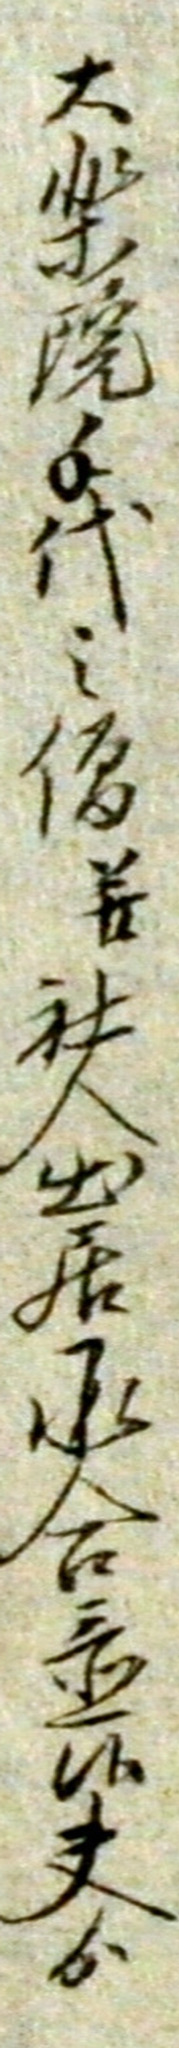次第大楽院手代之僧幷社人出居承合置候夫ゟ
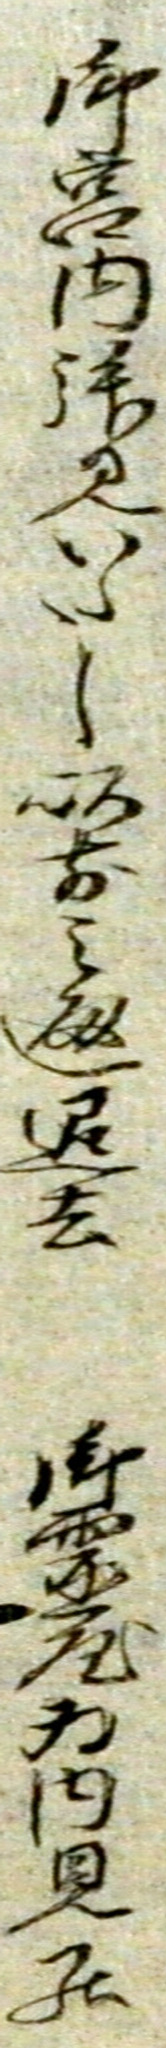御宮内拝見いたし以前之通退去御霊屋為内見罷越
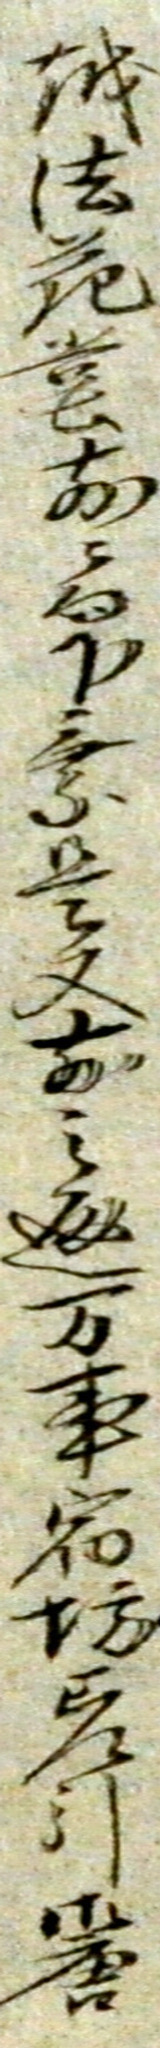法花堂前ニ而下乗是又前之通万事宿坊差引御唐門内江
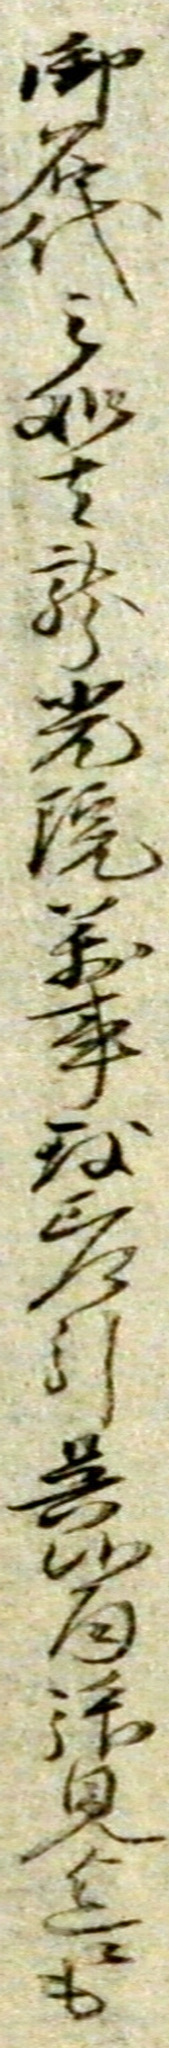御名代之処者龍光院万事致差引呉候間拝見迄二も
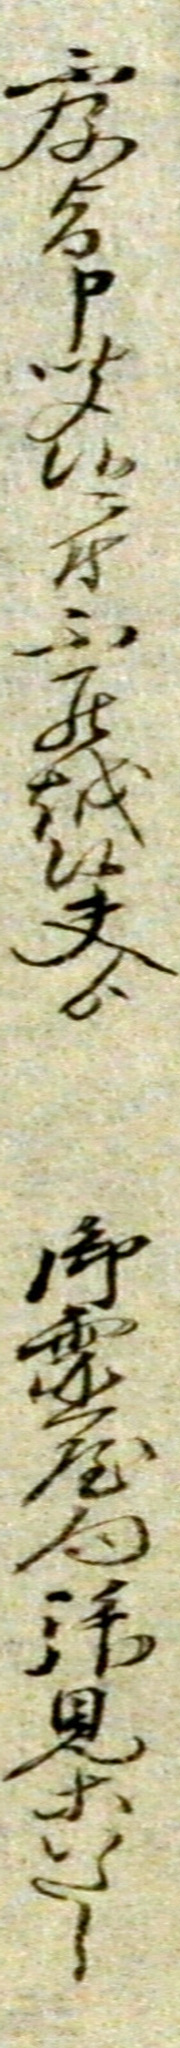不及旨申聞候ニ付不罷越候夫ゟ御霊屋向拝見抔いたし
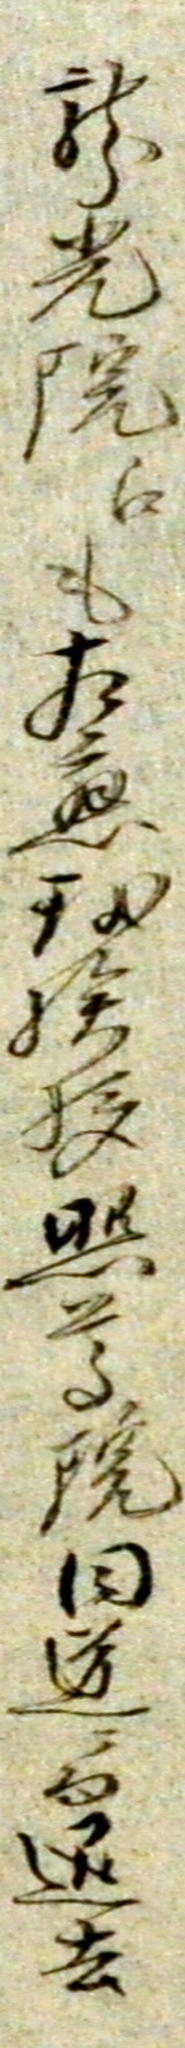龍光院江も相応致挨拶照尊院同道ニ而退去
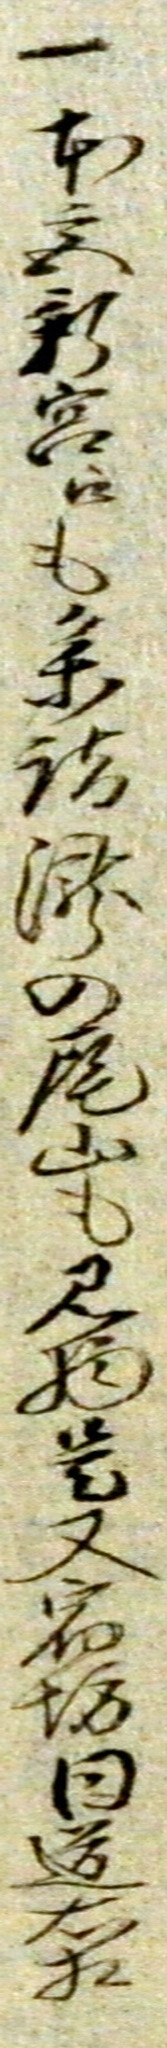一本宮新宮江も参詣瀧之尾山も見物是又宿坊同道右相済宿坊
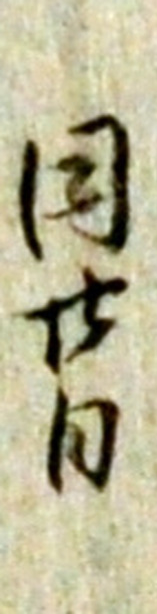同廿日
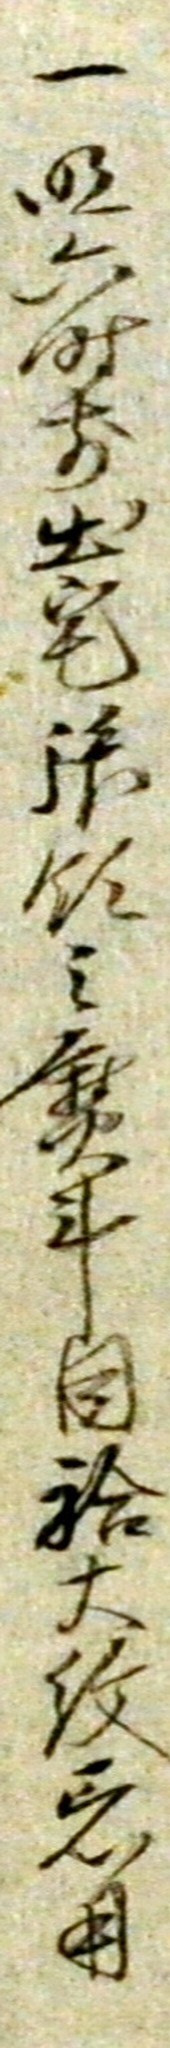一明六時前出宅拝領之熨斗目袷大紋着用
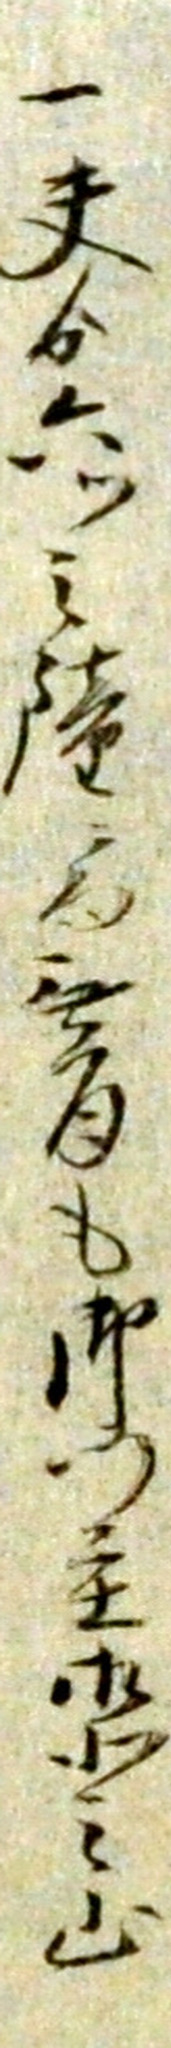一夫ゟ六ツ之鐘二而無間も御門主御登山
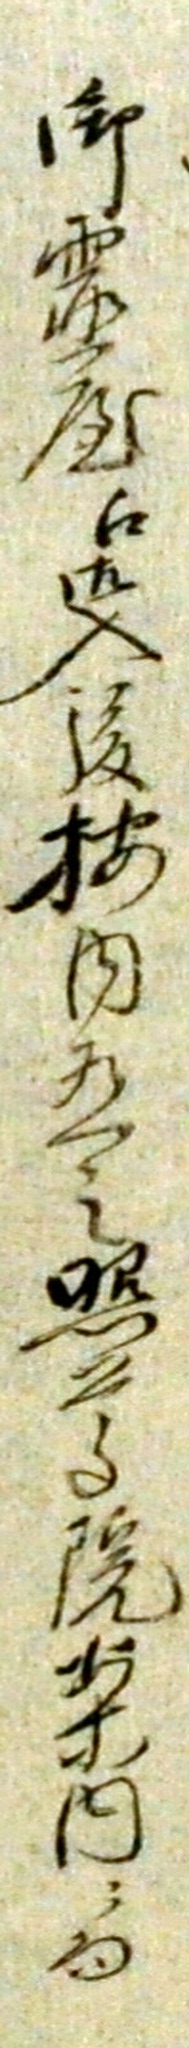御霊屋江御入後按内有之照尊院案内ニ而
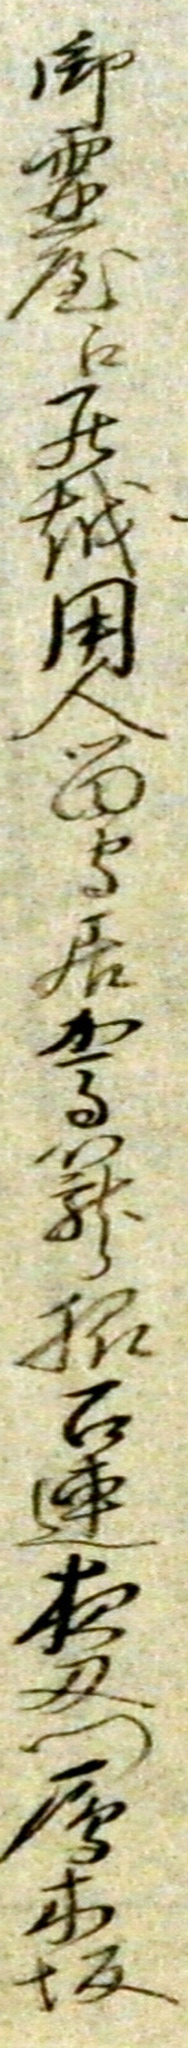御霊屋江罷越用人留守居駕籠脇召連夜叉門雁木坂下ニ而
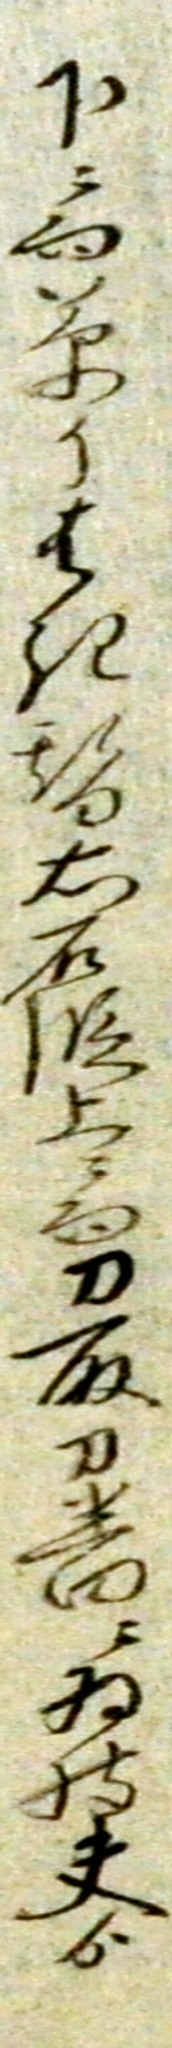草履者起替右石段上二而刀取刀番二為持夫ゟ
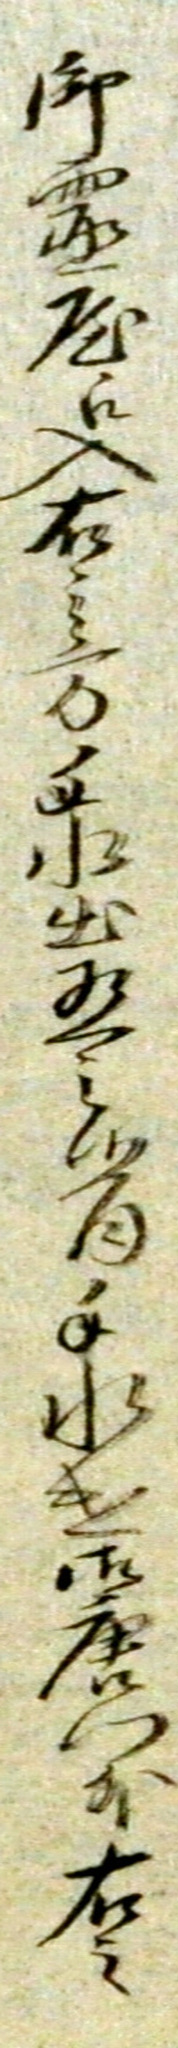御霊屋江入右之方手水出有之候間手水遣御唐門外右之
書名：日光御名代相勤候節ノ留
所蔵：伊那市立高遠町図書館・合同会社AMANE
